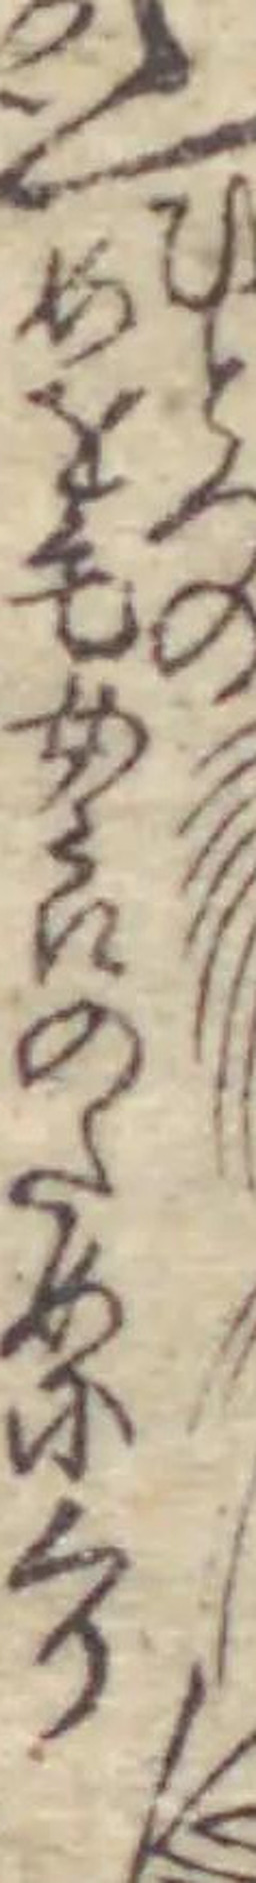めを毛女郎のためにくり
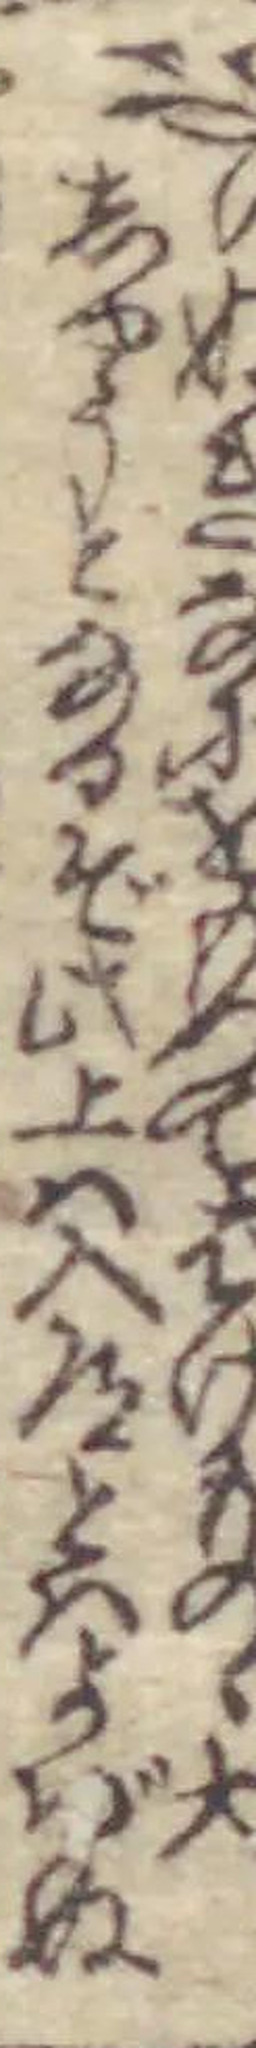しやうとなるぞ此上は入道とはよばぬ
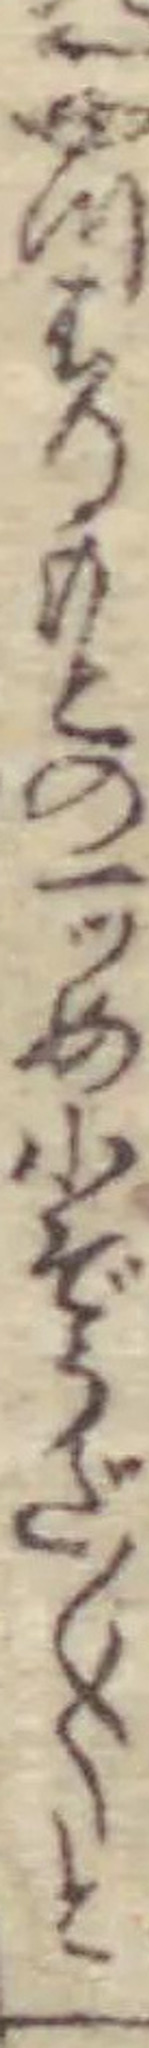やつはりもとの一つめ小ぞうだ〳〵〳〵と
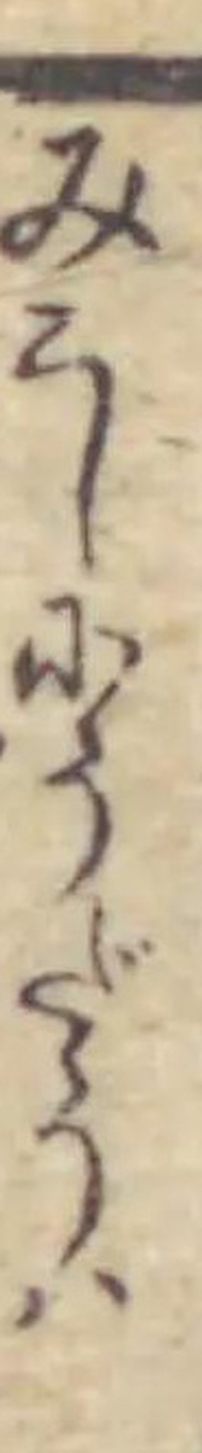みこしにうだうは
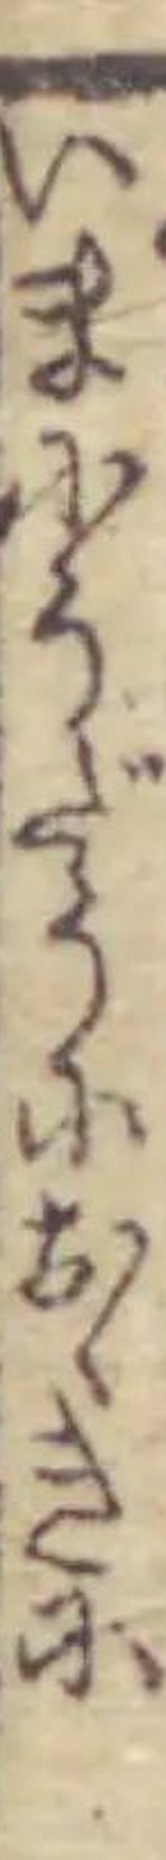いまにうだうにおゝきに
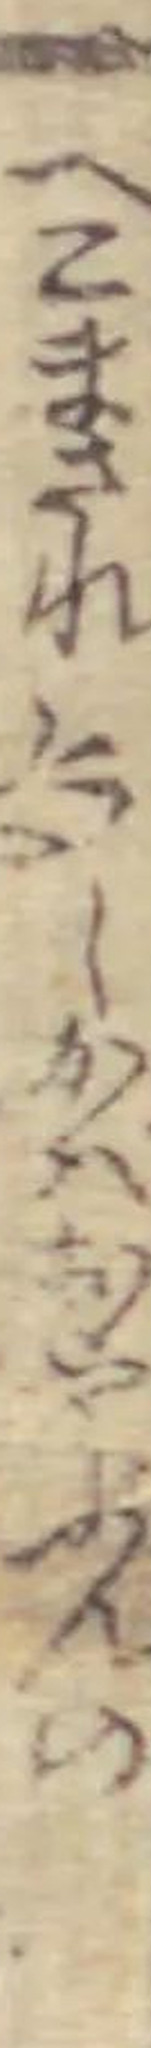へこまされしかばおやぶんの
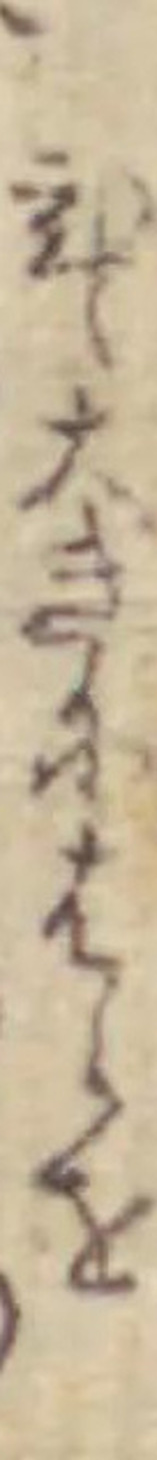ひゝ大きにはらを
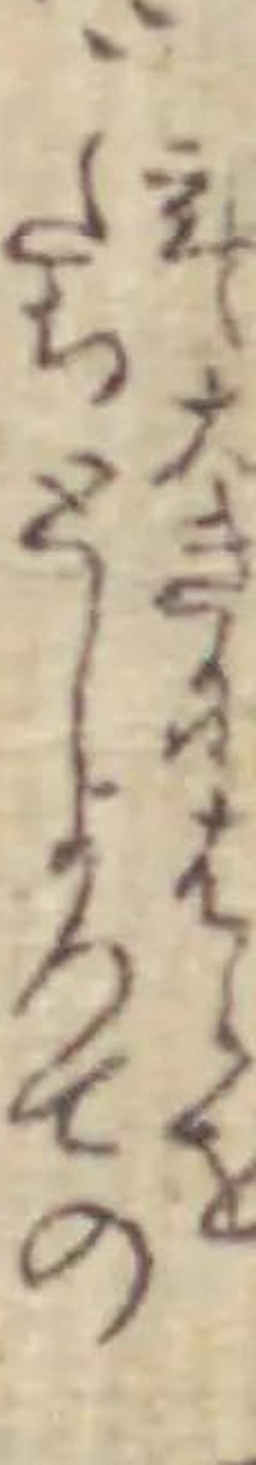たちとしよつての
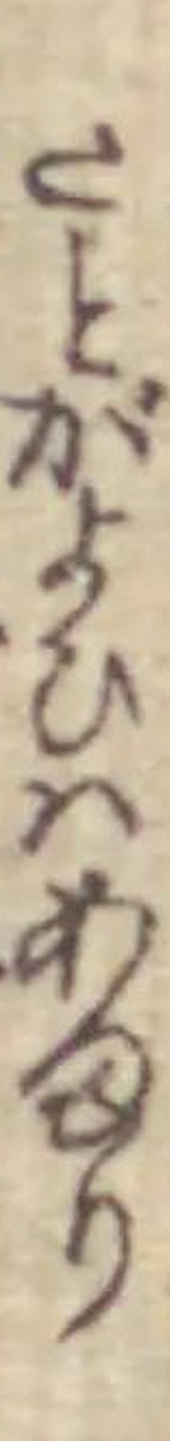さとがよひはあまり
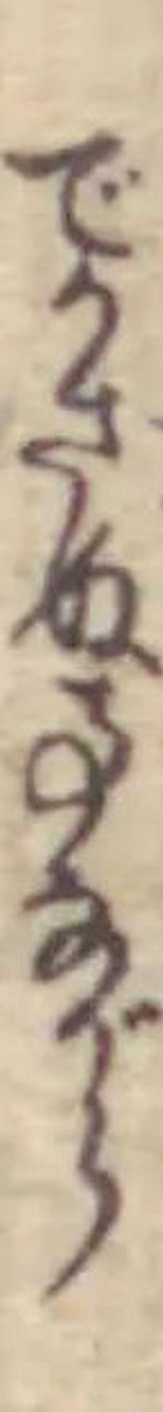でかさぬ事ながら
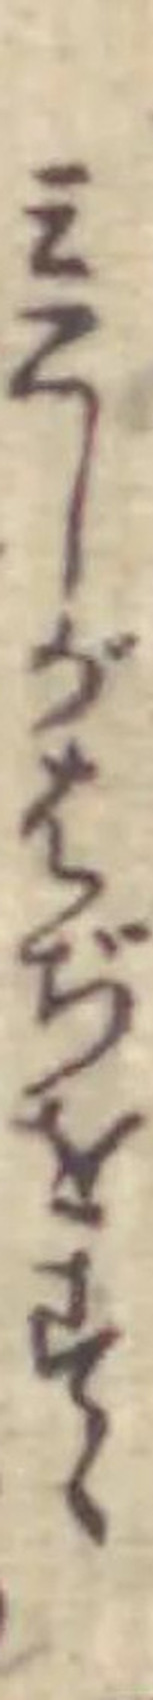みこしがはぢをすゝ
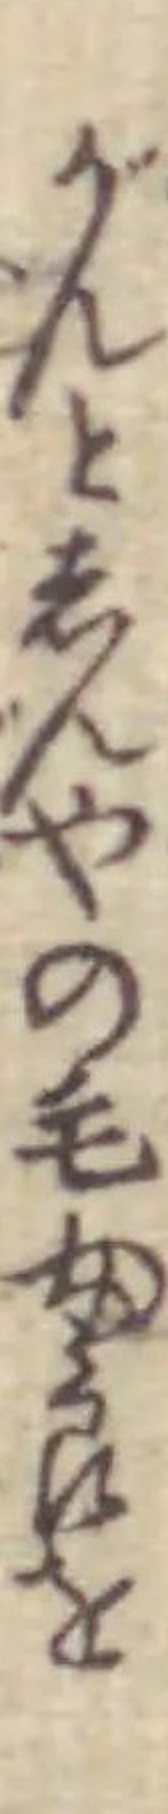がんとしんやの毛女郎を
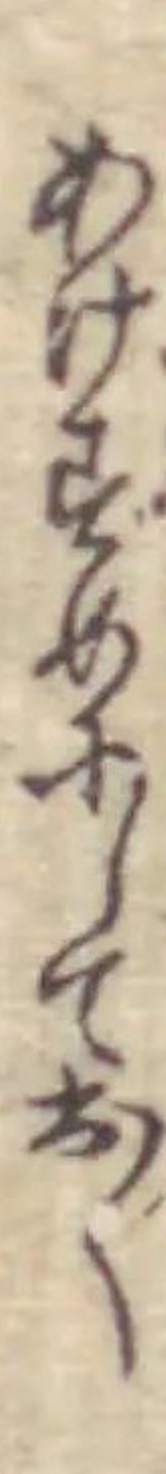あげぞめにしておく
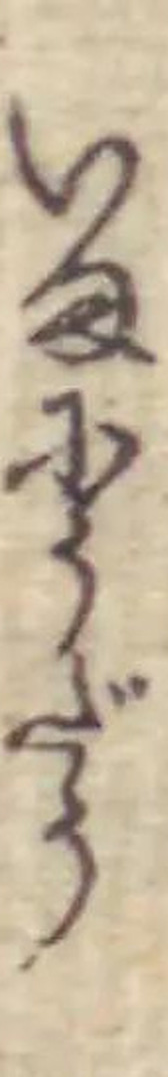いまにうだう
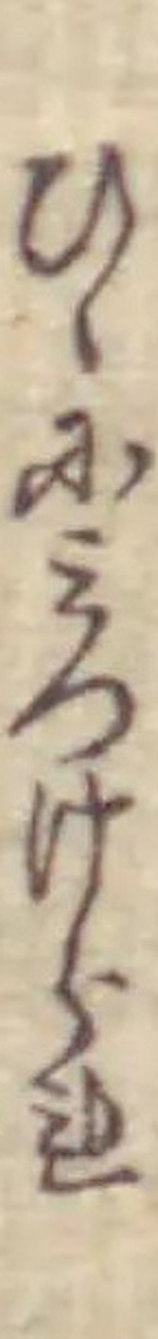ひゝにみつけられ
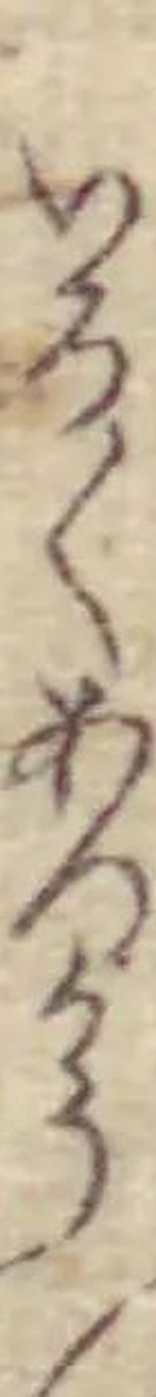いろ〳〵あつかう
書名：大昔化物双紙 2巻
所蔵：国立国会図書館 National Diet Library, JAPAN
